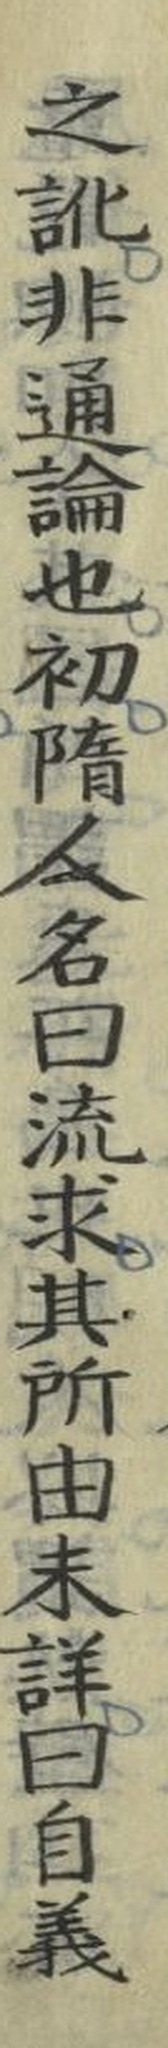之訛。非通論也。初。隋人名曰流求。其所由未詳。曰自義
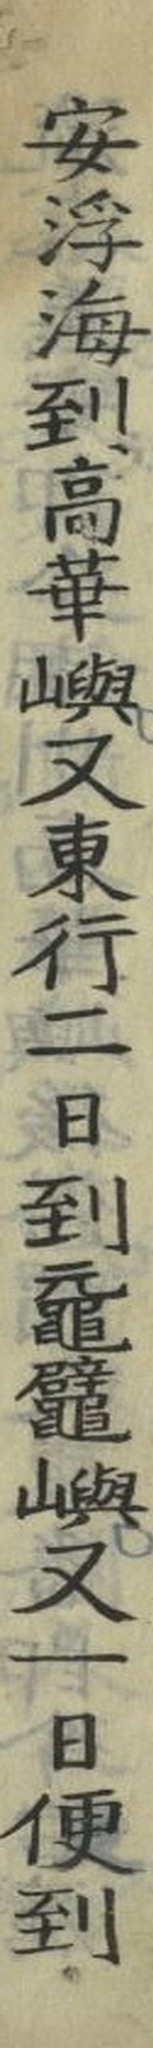安浮海到高華嶼。又東行二日到黿鼊嶼。又一日便到

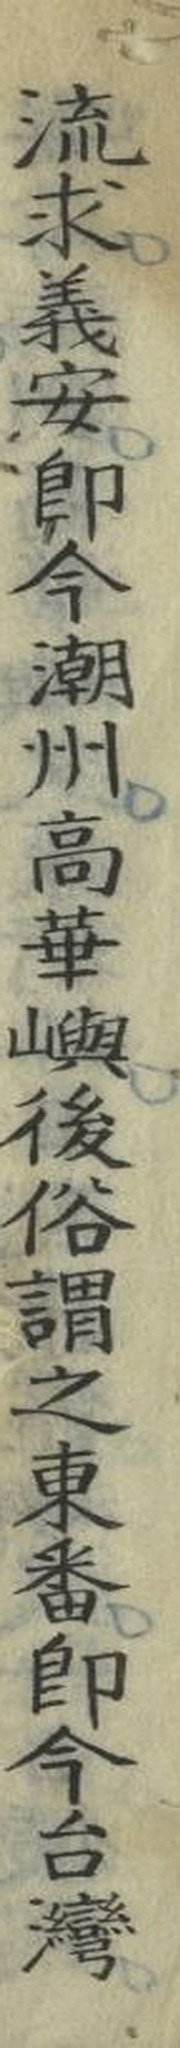流求。義安。卽今潮州。高華嶼。後俗謂之東番。卽今台灣。
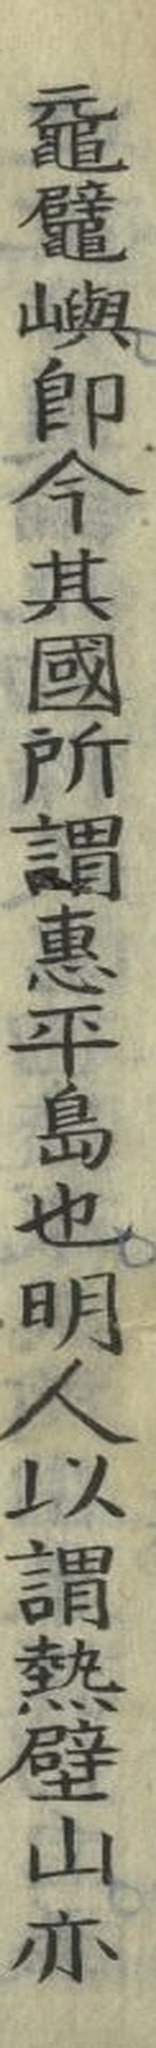黿鼊嶼。卽今其國所謂惠平島也。明人以謂熱壁山亦
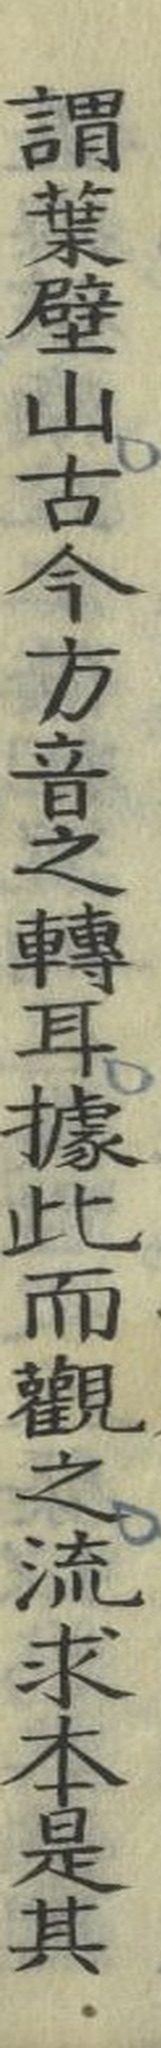謂葉壁山。古今方音之轉耳。據此而觀之。流求本是其
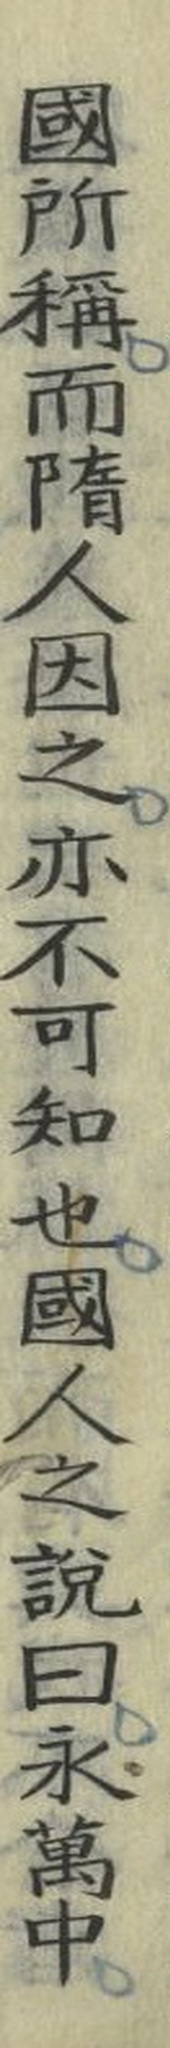國所稱。而隋人因之。亦不可知也。國人之說曰。永萬中。
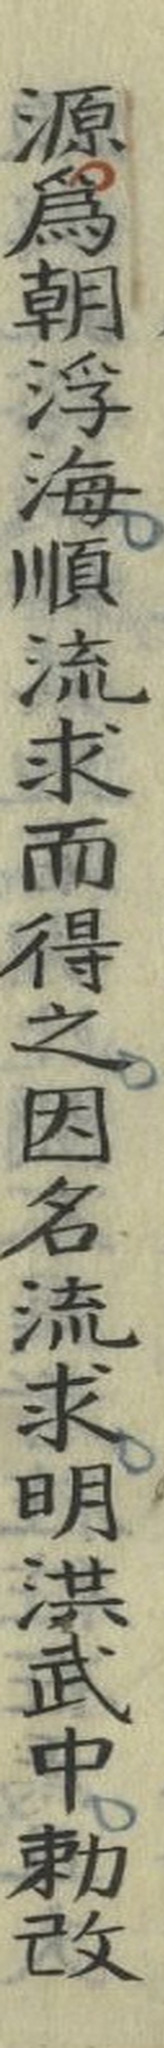源爲朝浮海。順流求而得之。因名流求。明洪武中。勅改
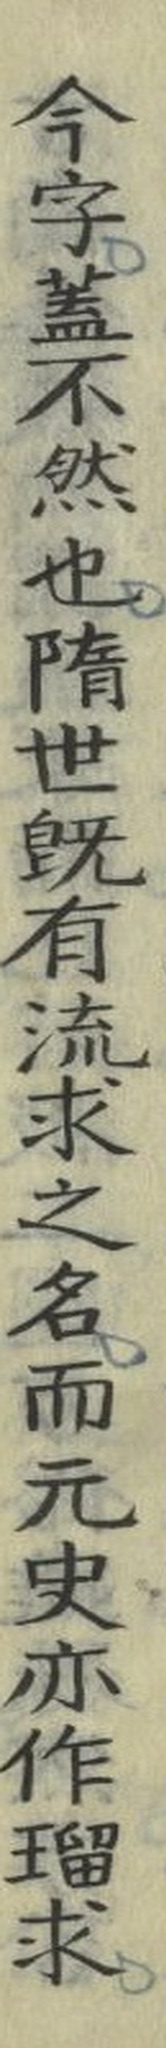今字。蓋不然也。隋世既有流求之名。而元史亦作瑠求。
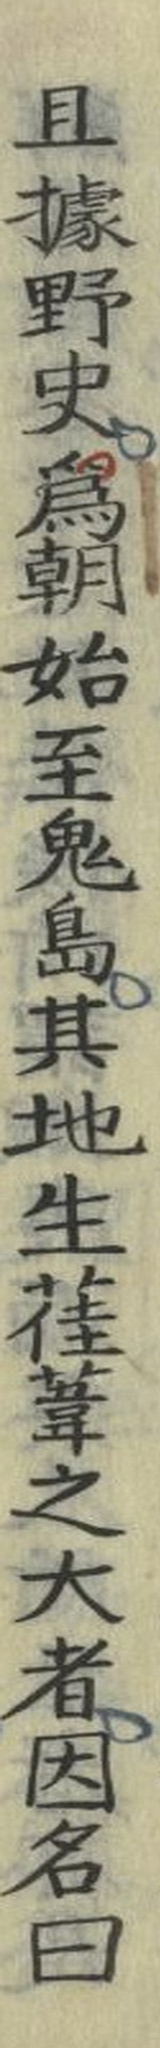且據野史。爲朝始至鬼島。其地生葦之大者。因名曰
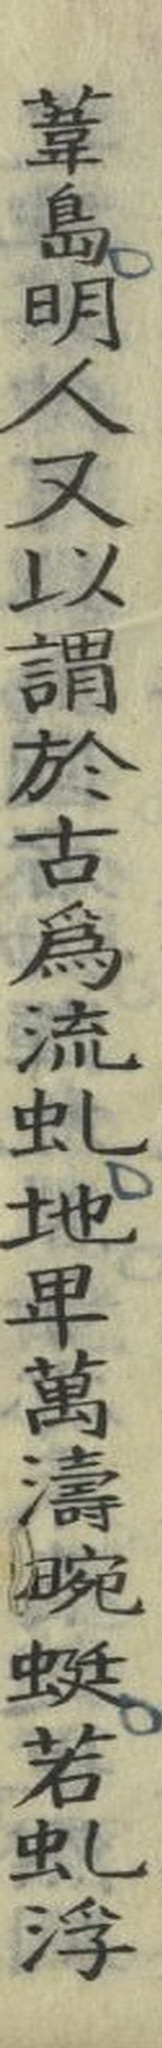葦島。明人又以謂於古爲流虬。地卑萬濤晼蜒。若虬浮
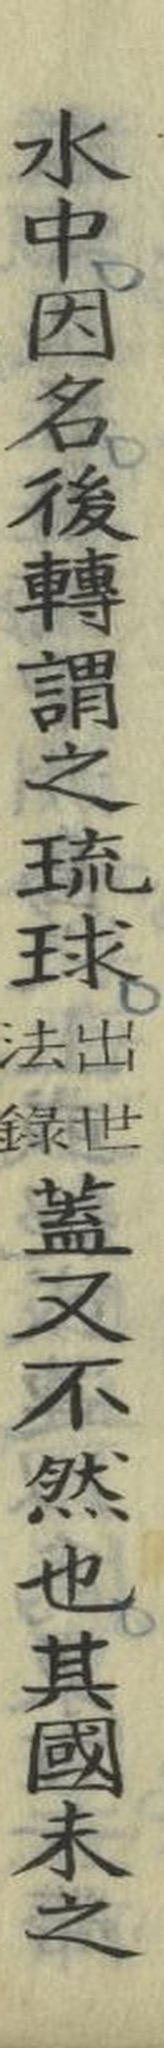水中。因名。後轉謂之琉球。出世法錄蓋又不然也。其國未之
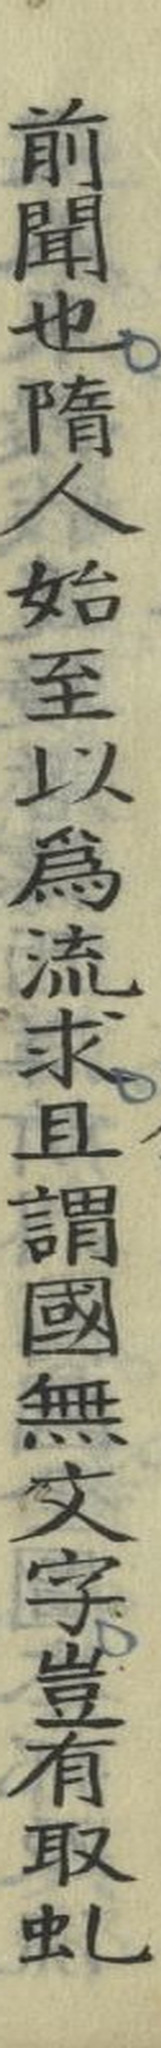前聞也。隋人始至以爲流求。且謂國無文字。豈有取虬
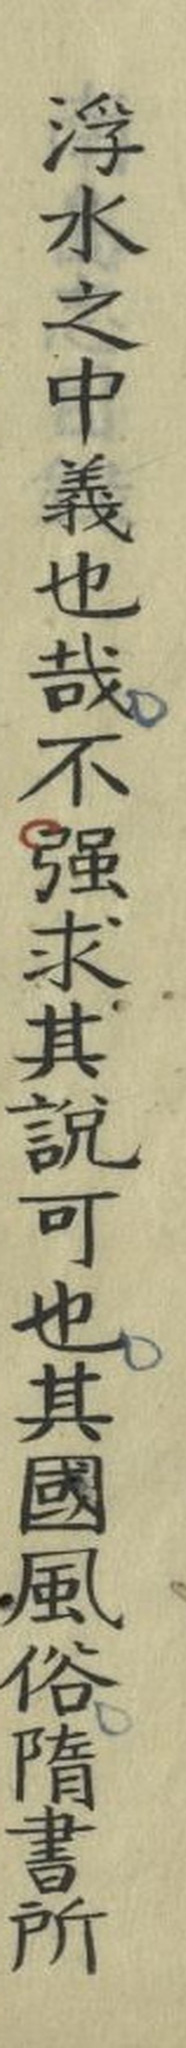浮水之中義也哉。不强求其說可也。其國風俗。隋書所
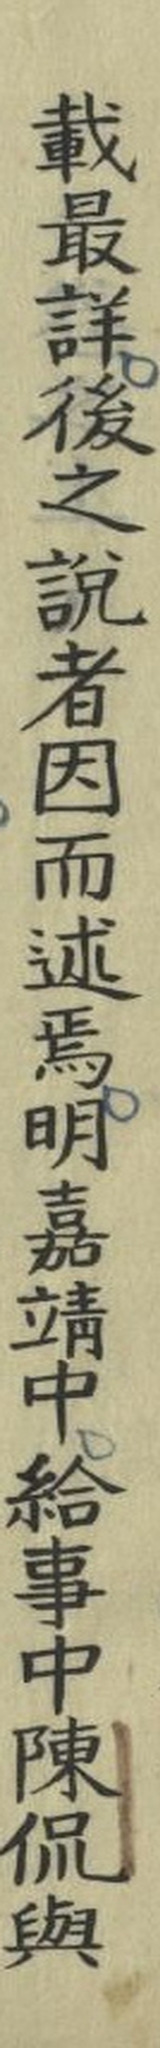載最詳。後之說者因而述焉。明嘉靖中。給事中陳侃與
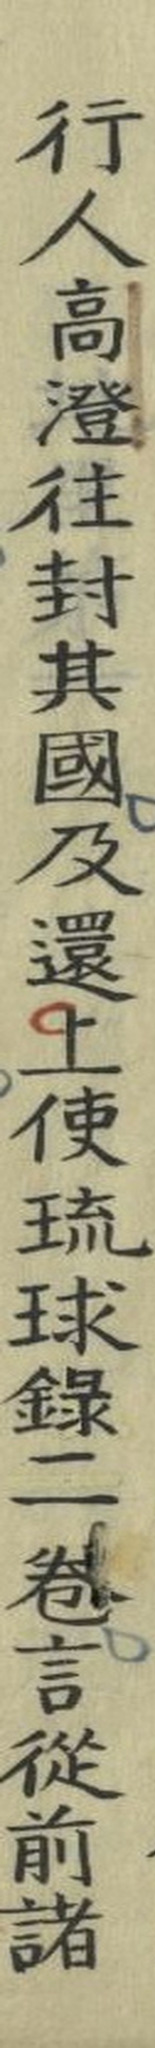行人高澄往封其國。及還上使琉球錄二卷。言從前諸
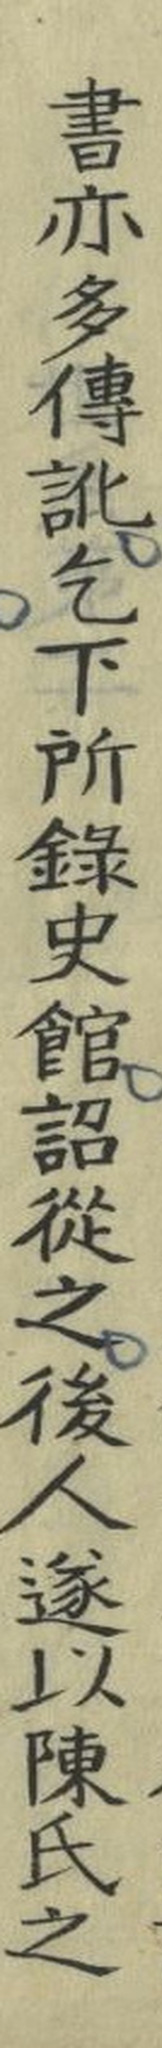書亦多傳訛。乞下所錄史館。詔從之。後人遂以陳氏之
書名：南島志
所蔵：University of the Ryukyus Library
